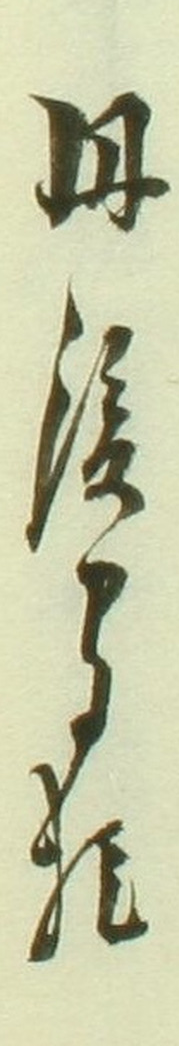丹後守様
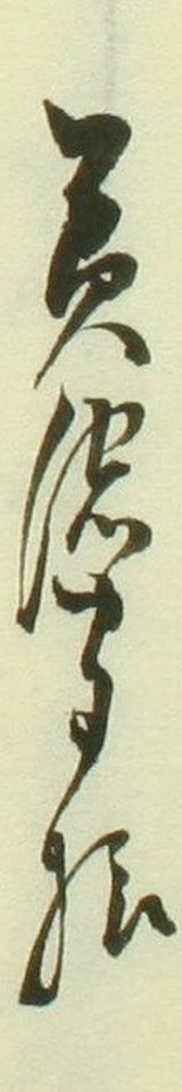美濃守様
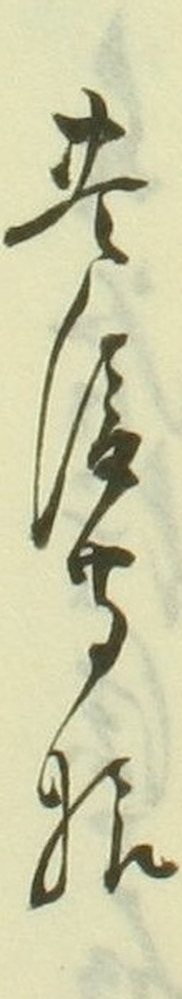豊後守様
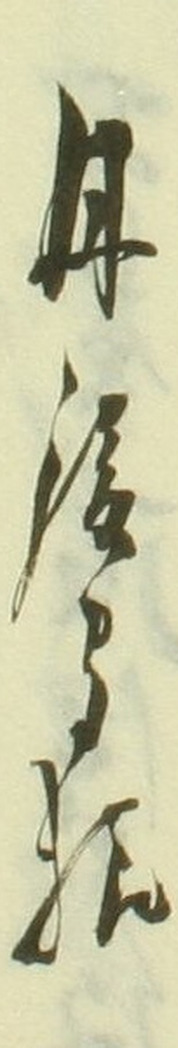丹後守様
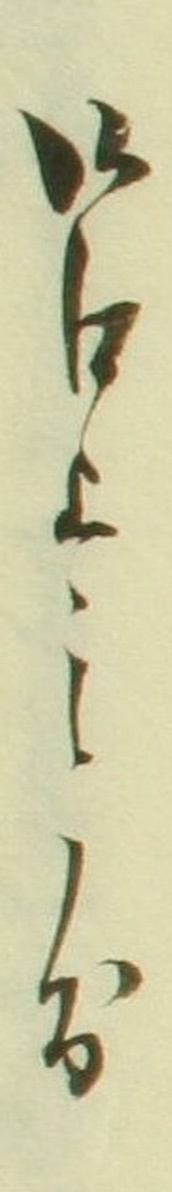御口上之分

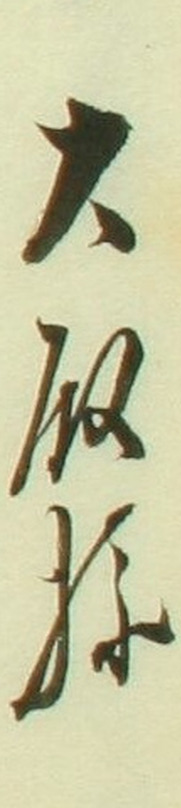大殿様
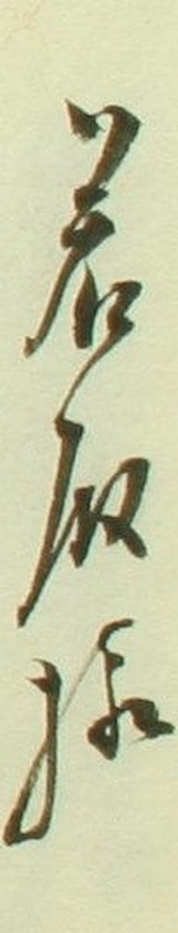若殿様
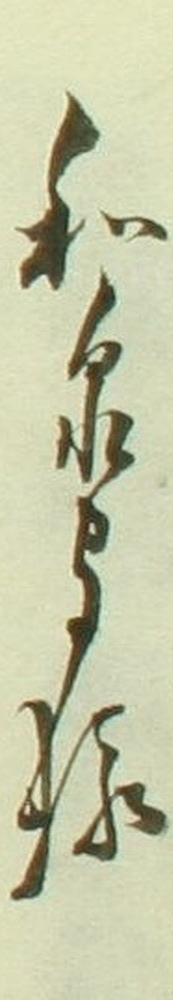和泉守様
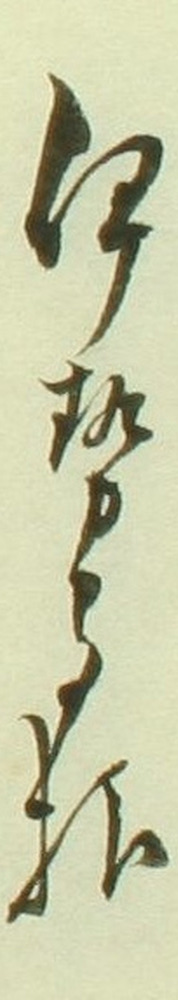伊勢守様
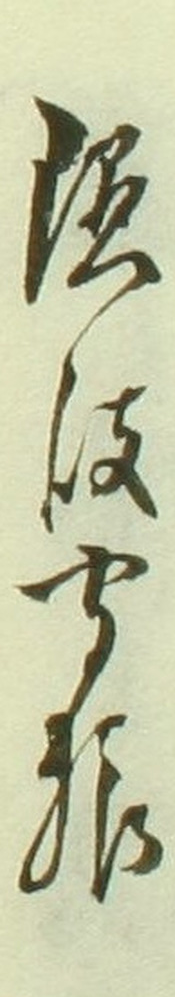隠岐守様
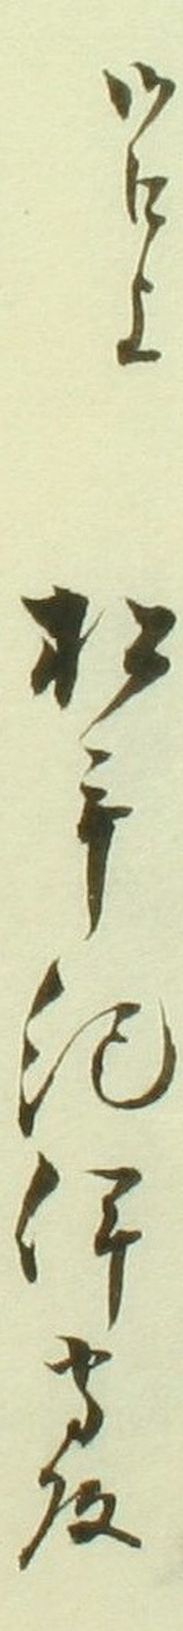御口上松平紀伊守様
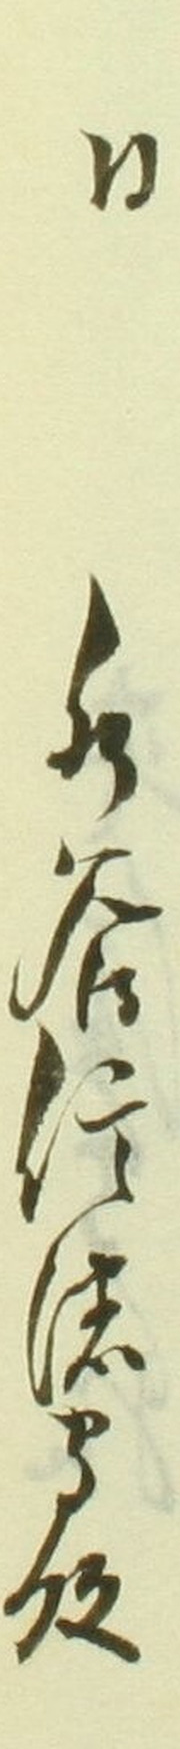同水谷信濃守様
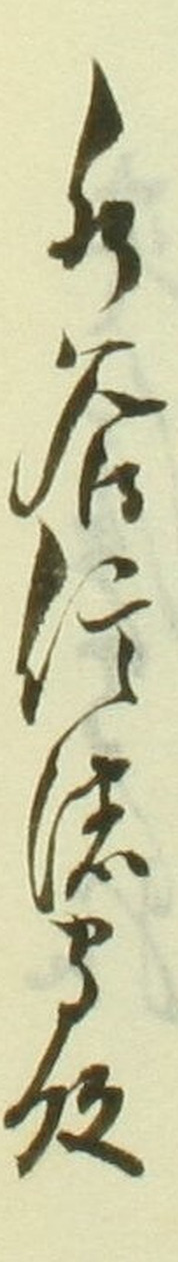同水谷信濃守様
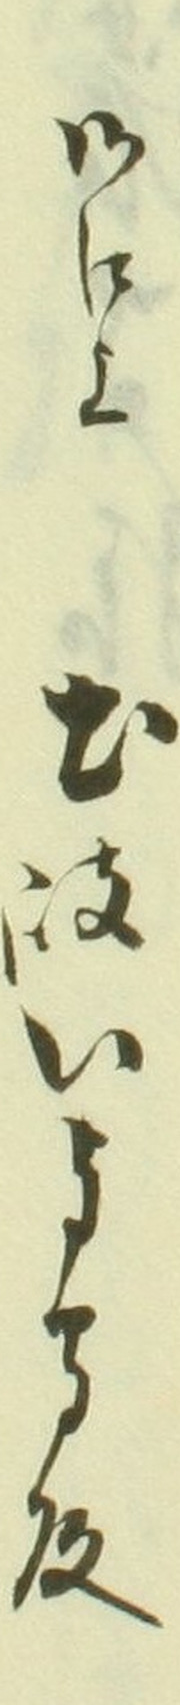御口上土岐い与守殿
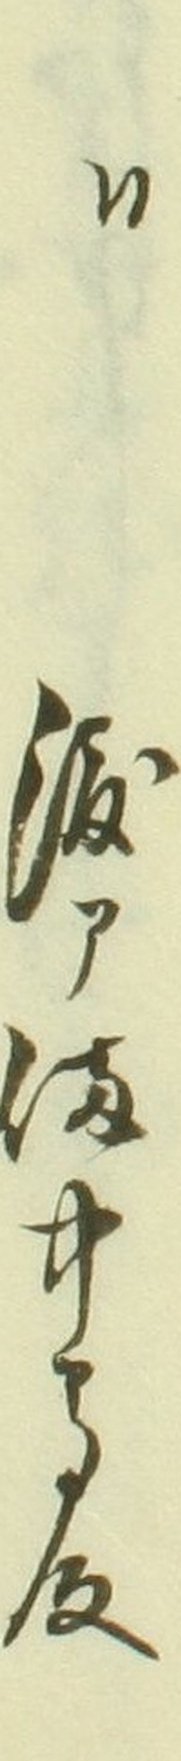同渡部備中守殿
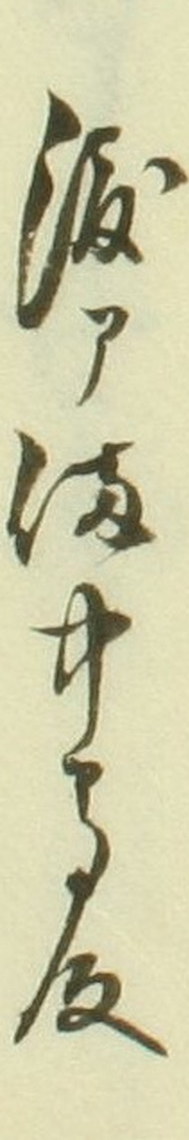同渡部備中守殿
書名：異国船漂着記
